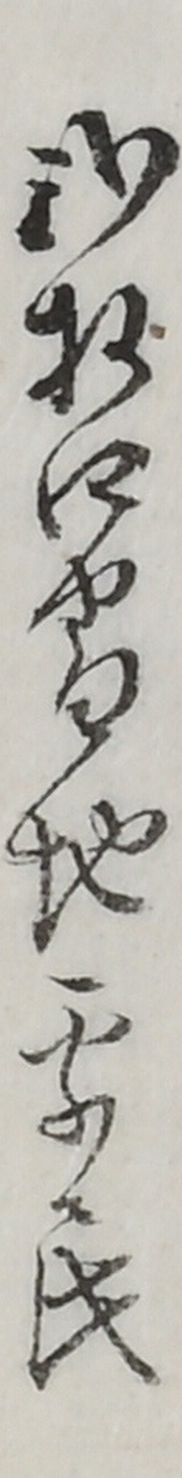弐拾四番地平民

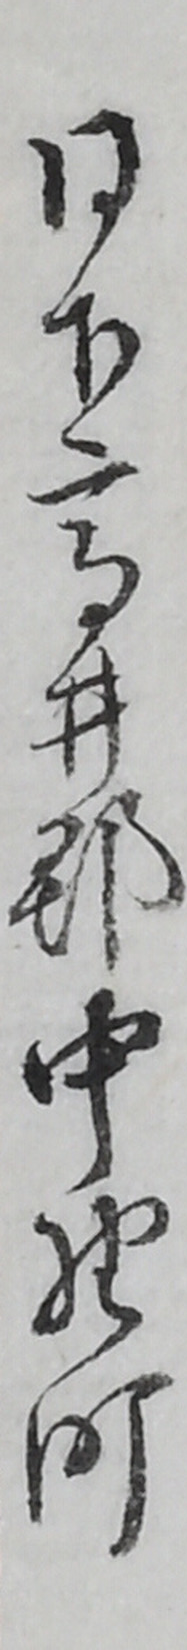同下高井郡中野町
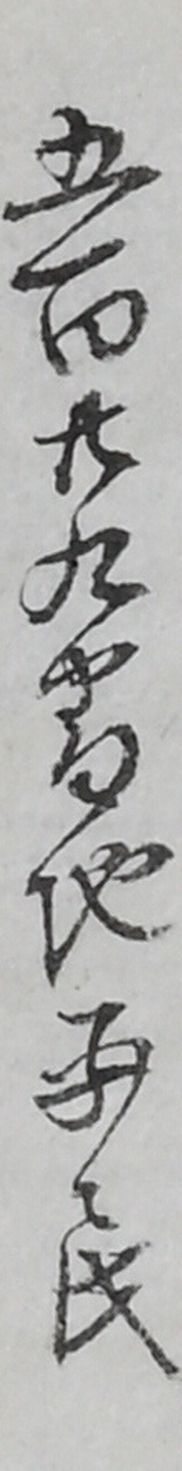五百廿九番地平民
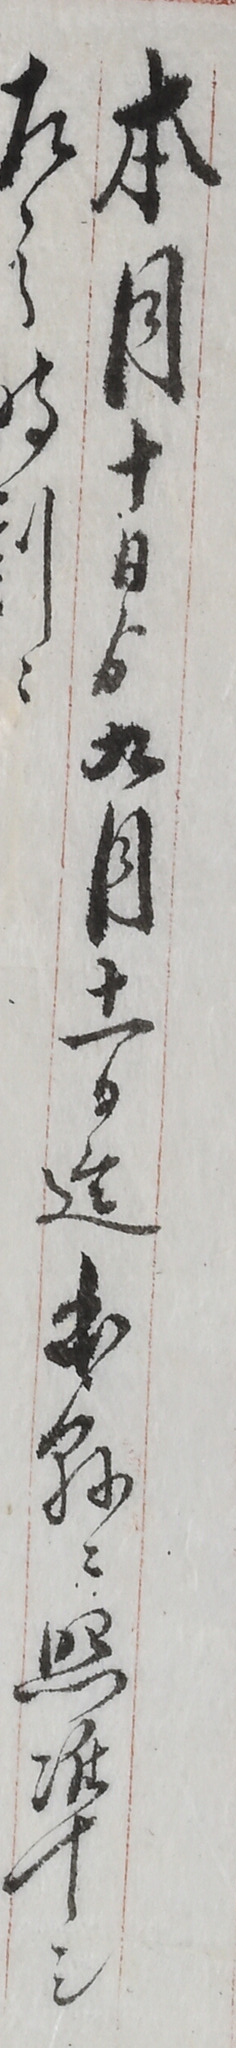本月十日ゟ九月十一日迄本県ニ照準シ
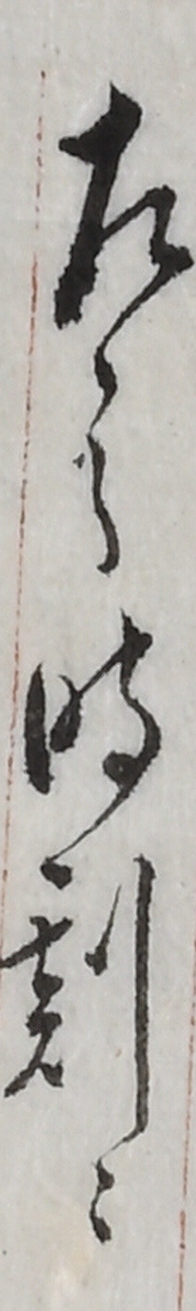左之時刻ニ
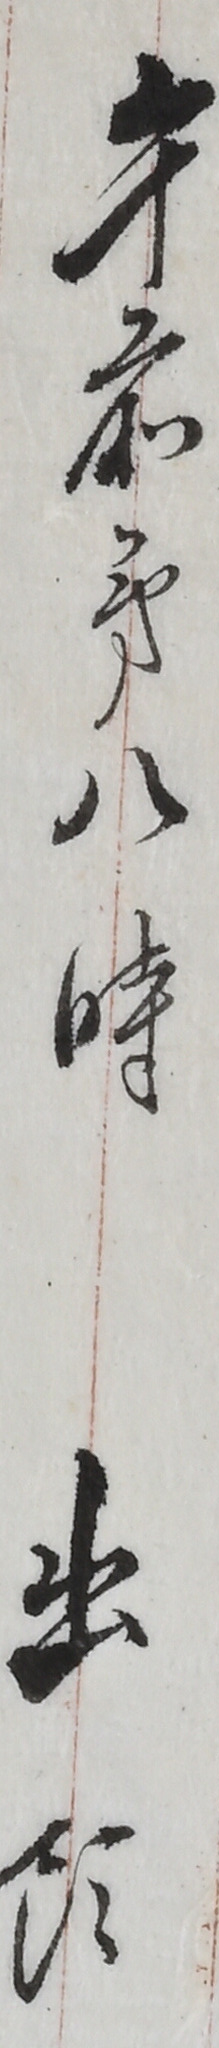午前第八時出頭
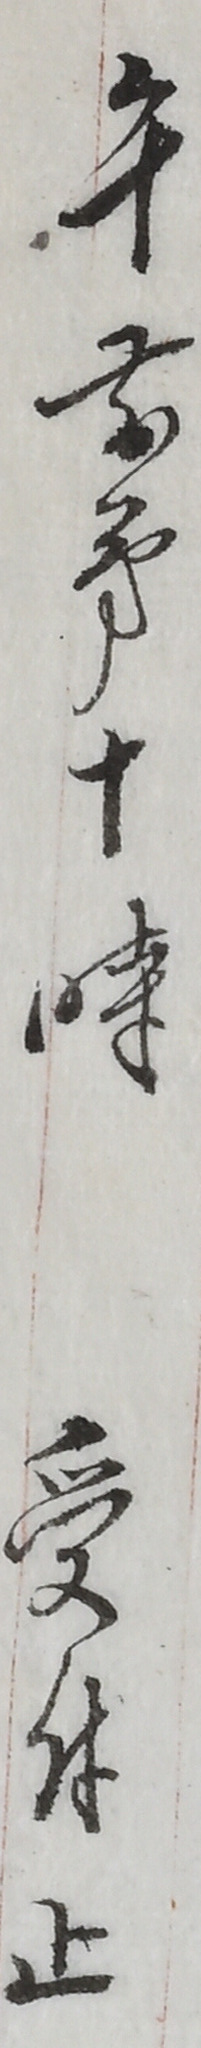午前第十時受付止
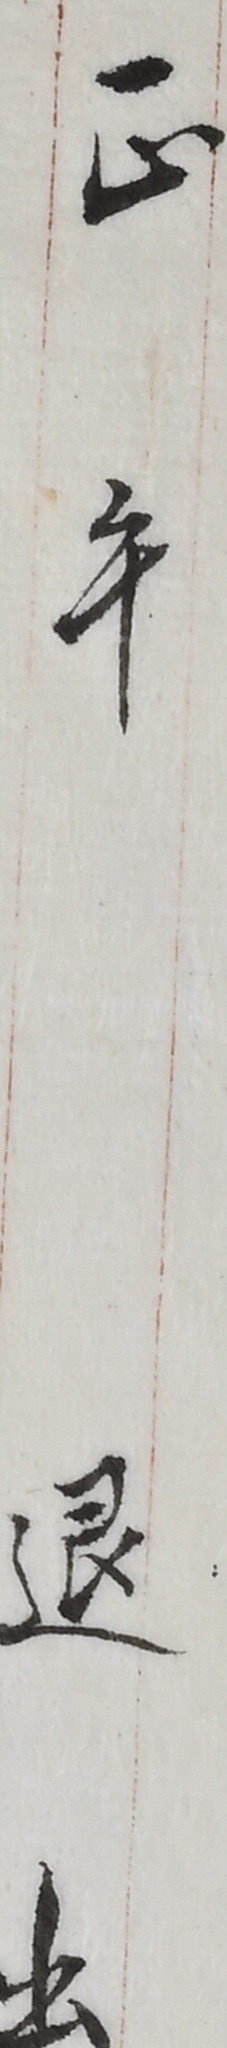正午退出
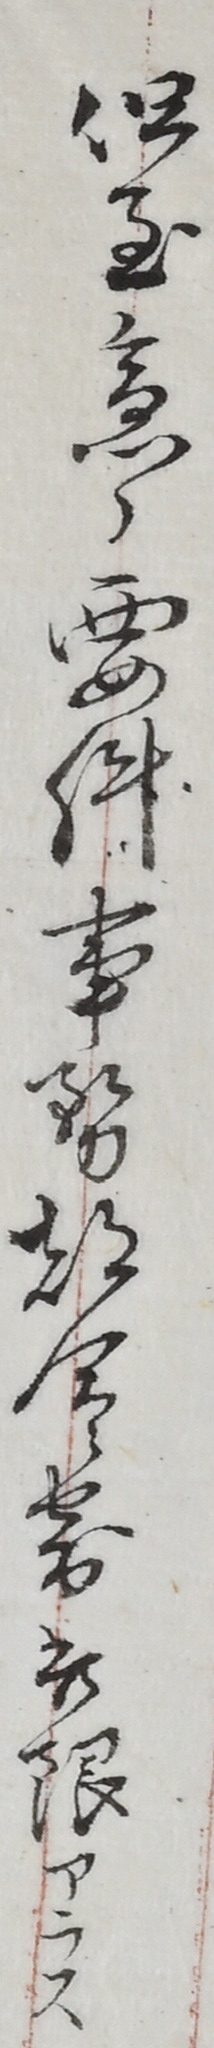但至急ノ要件事務都合ニ寄此限アラス
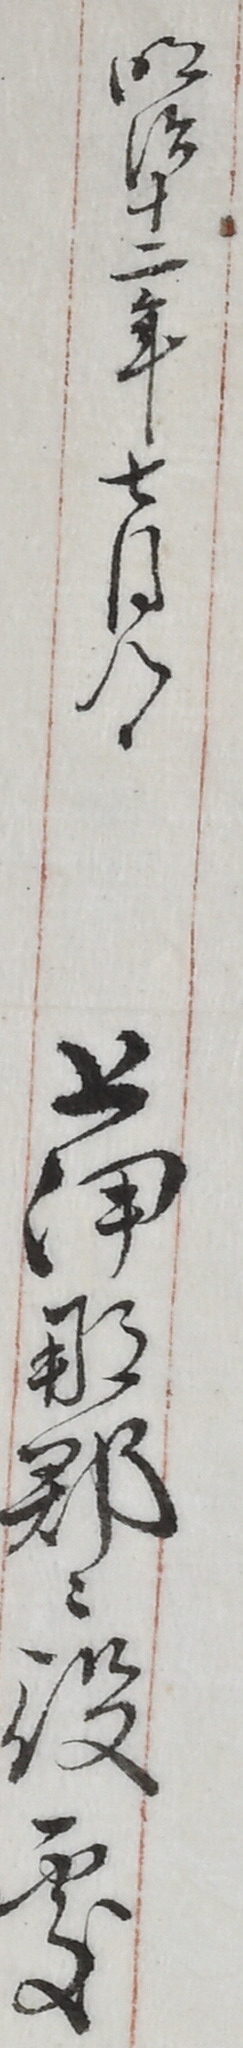明治十二年七月八日上伊那郡々役処

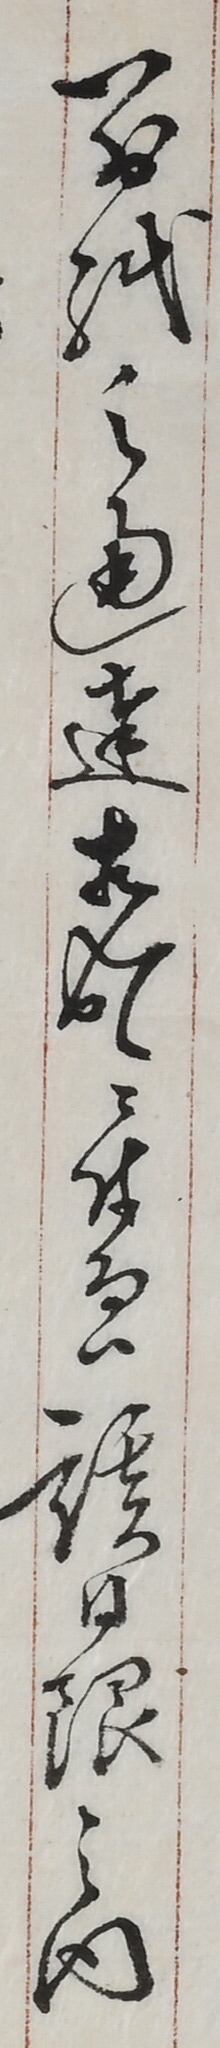別紙之通達相成候ニ付而ハ該日限之内
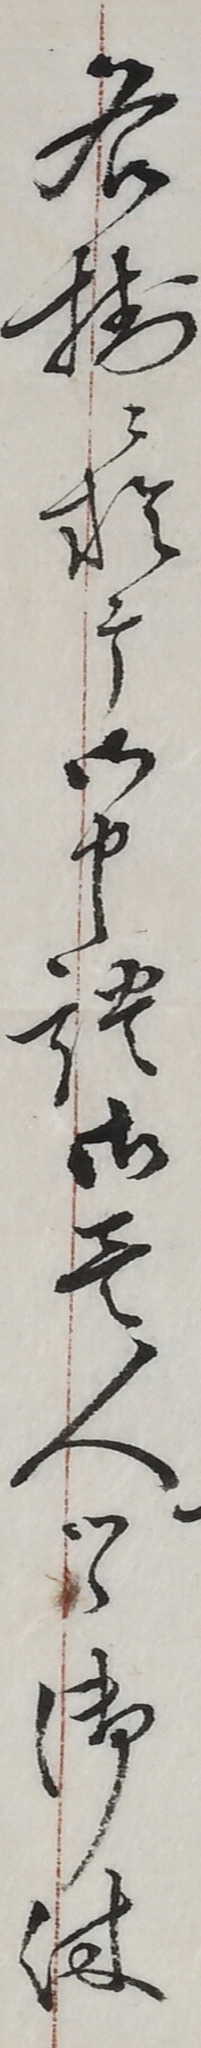各掛ニ於テ御申談御壱人ツヽ御休
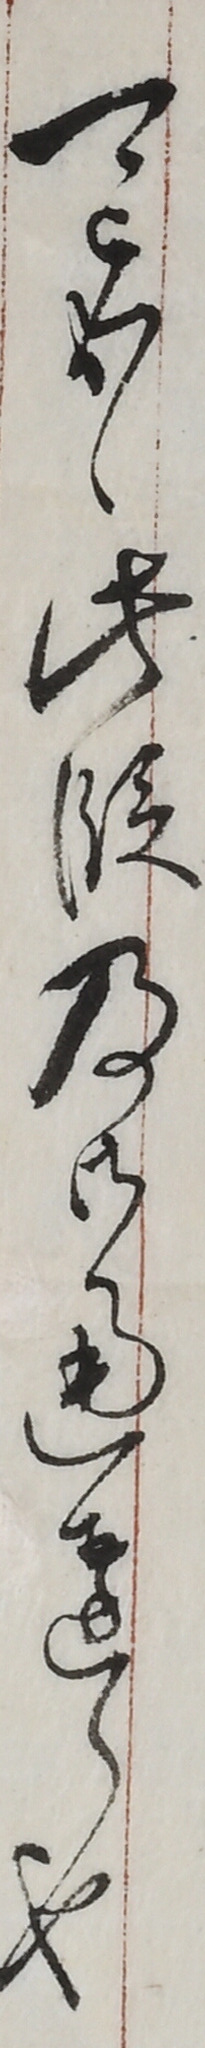可被成候此段及御通達候也
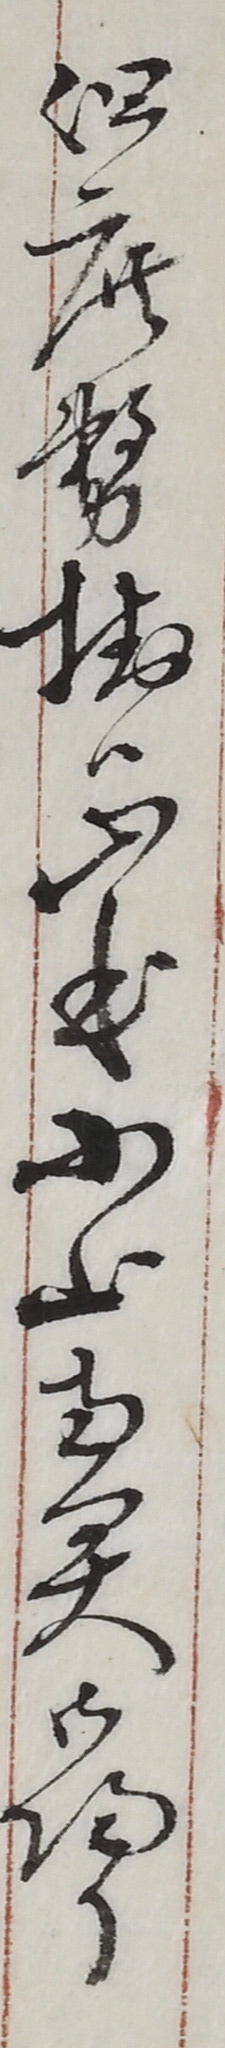但庶務掛ハ山本小山両君御帰り
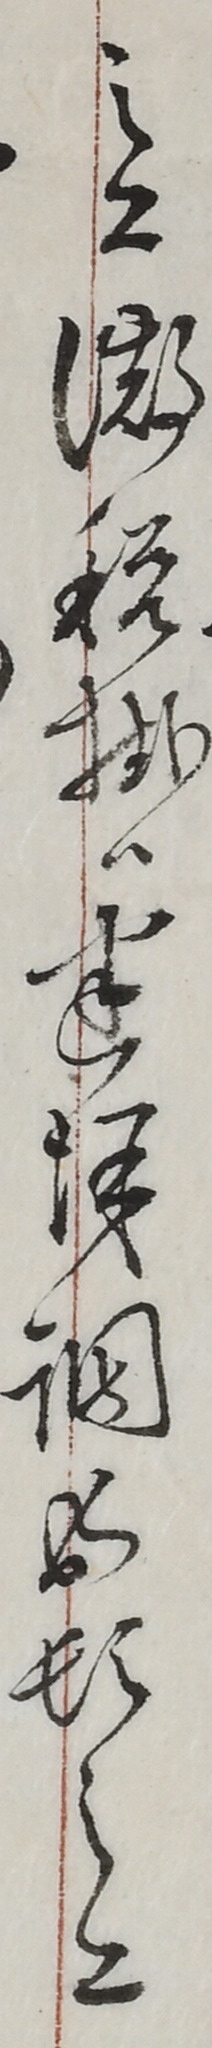之上徴税掛ハ建坪調成頓之上
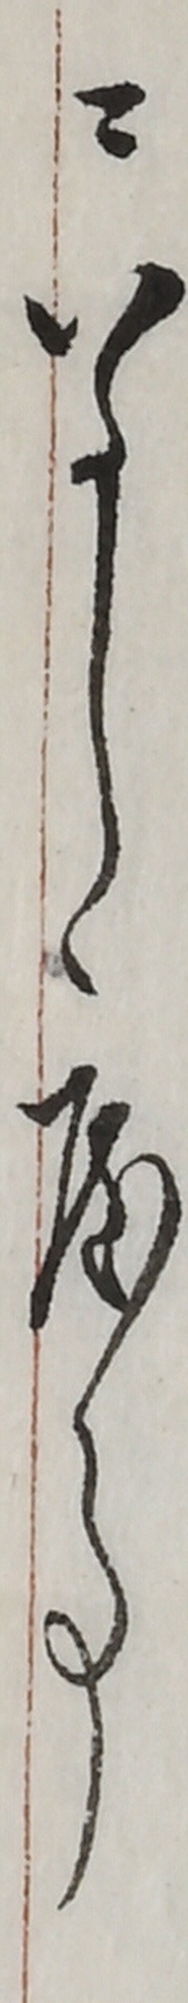にいたし度事
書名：郡役所勤務中御用抜書
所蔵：伊那市立高遠町図書館・合同会社AMANE
